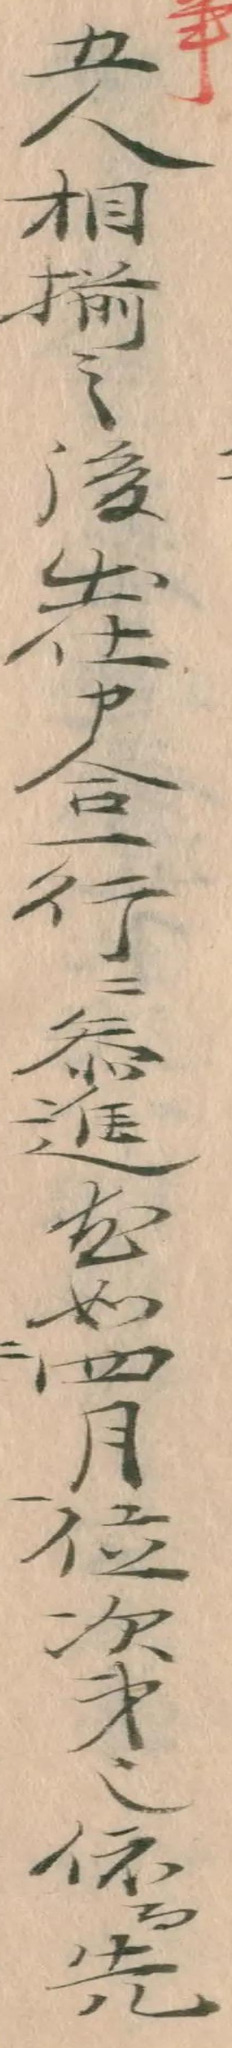五人相揃之後出仕申合行ニ添進尤如四月位次第也依而先
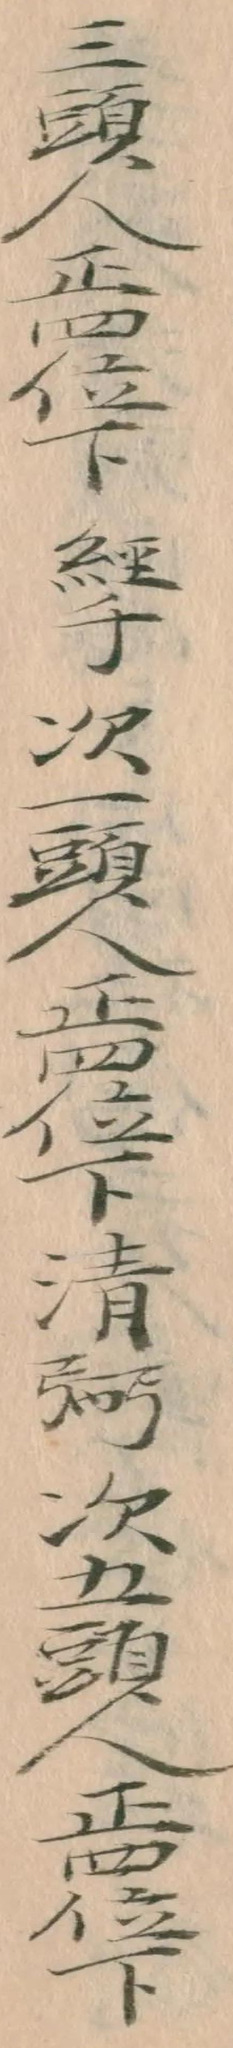三頭人正四位下経千次一頭人正四位下清弼次五頭人正四位下
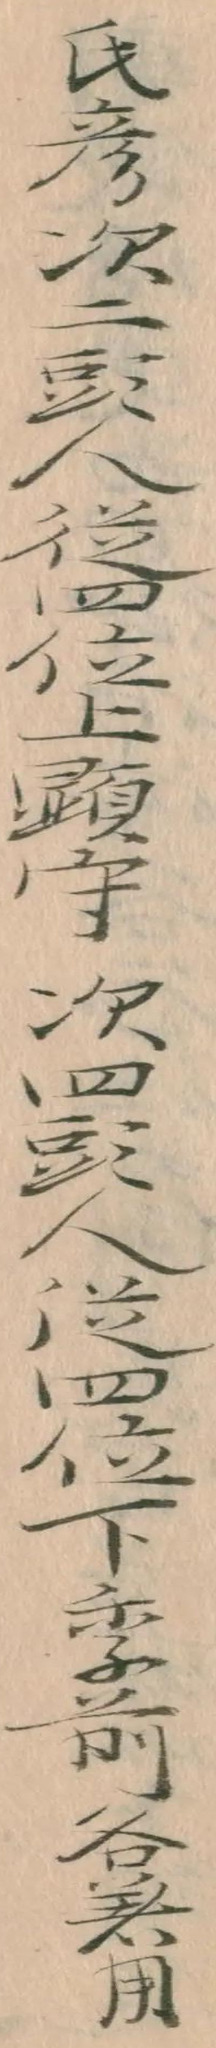氏彦次二頭人従四位上顕守次四頭人従四位下季前各着用
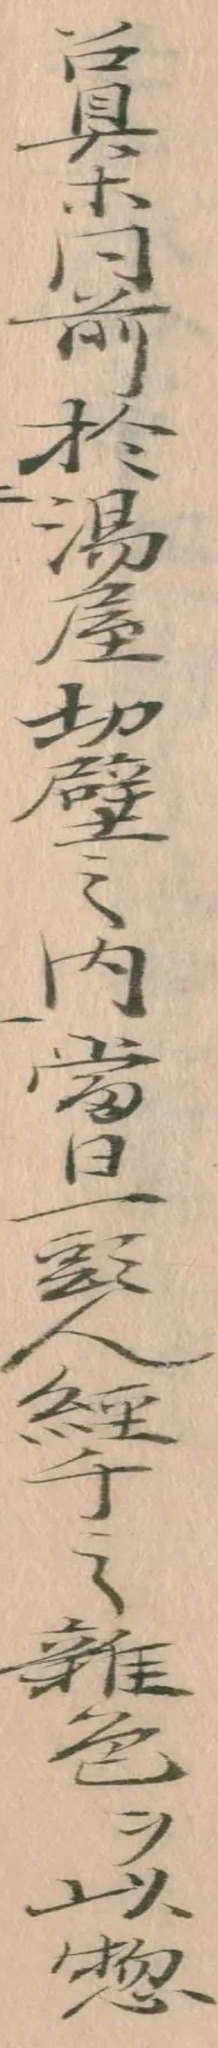召具等同前於湯屋切壁之内當日一頭人経千之雑色ヲ以惣
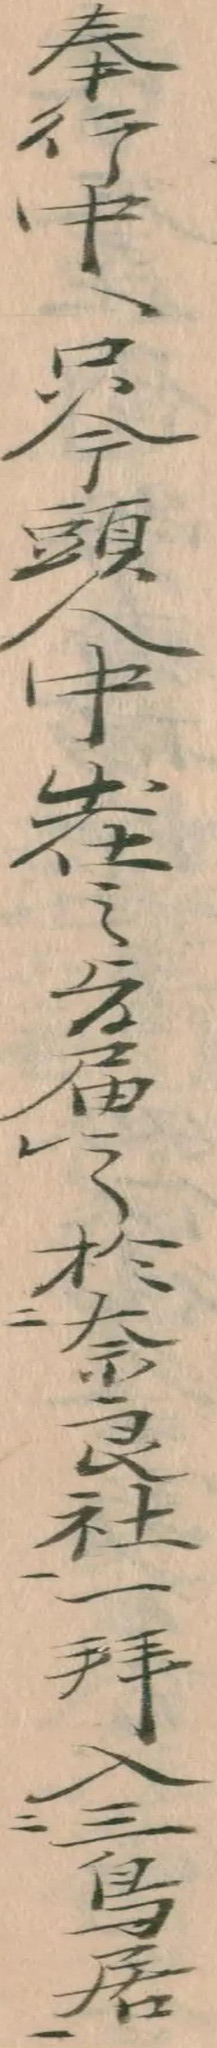奉行中へ只今頭人中出仕之旨届之於奈良社一拝入三鳥居
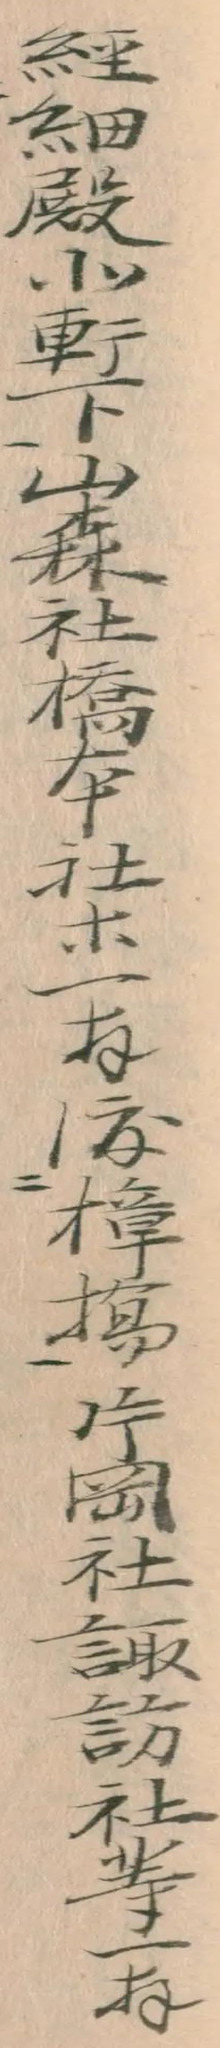経細殿北軒下山森社橋本社等一拝渡楠橋片岡社諏訪社等一拝
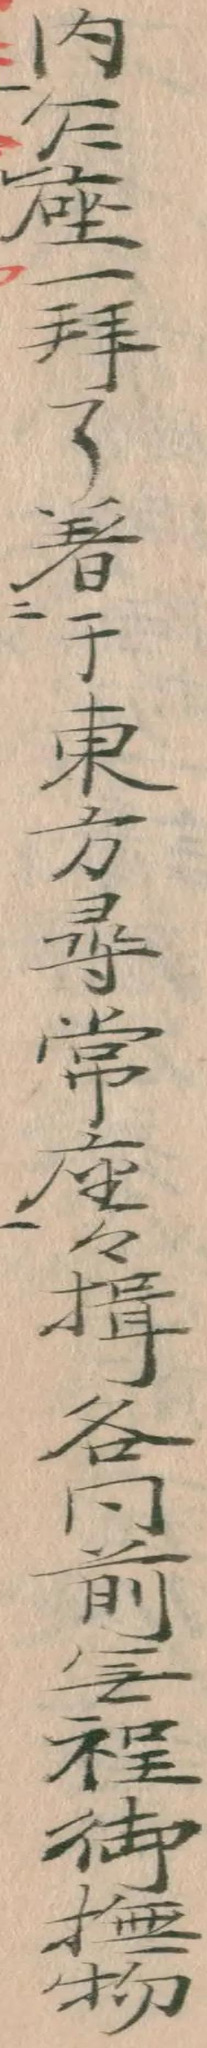内乍座一拝了着于東方尋常座々楫各同前無程御撫物
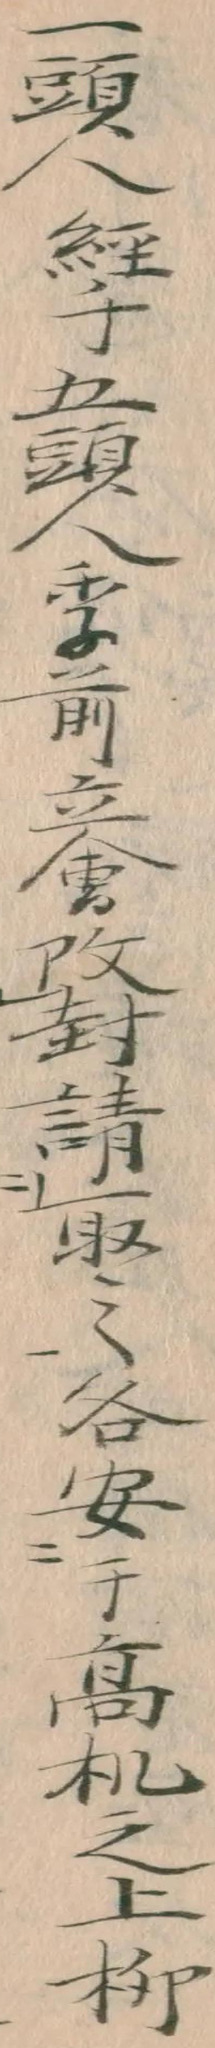一頭人経千五頭人季前立會改封請取之各安于高札之上柳

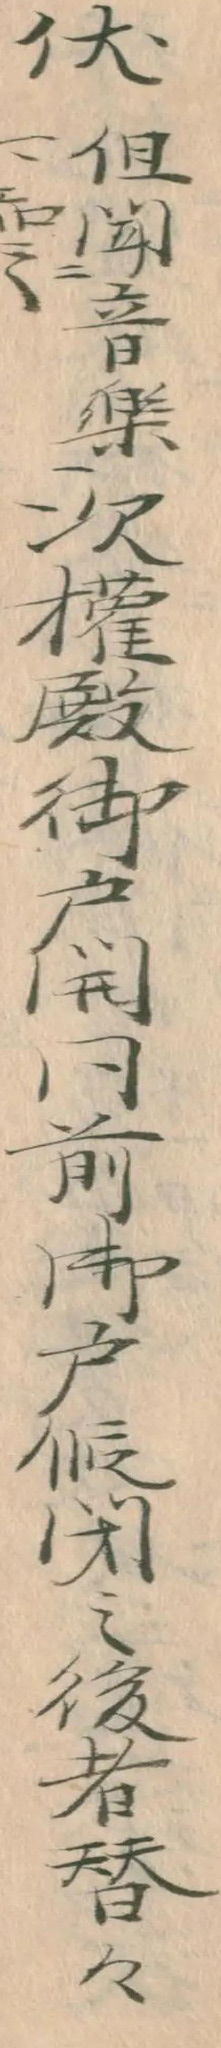尤但聞音楽可知之次權殿御戸開同前御戸假閉之後者替々
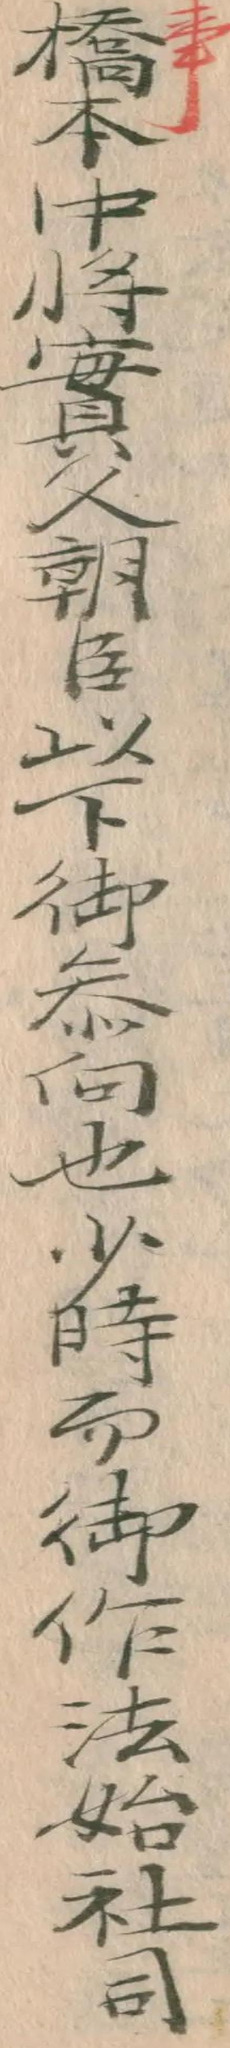橋本中将實久朝臣以下御参向也少時而御作法始社司
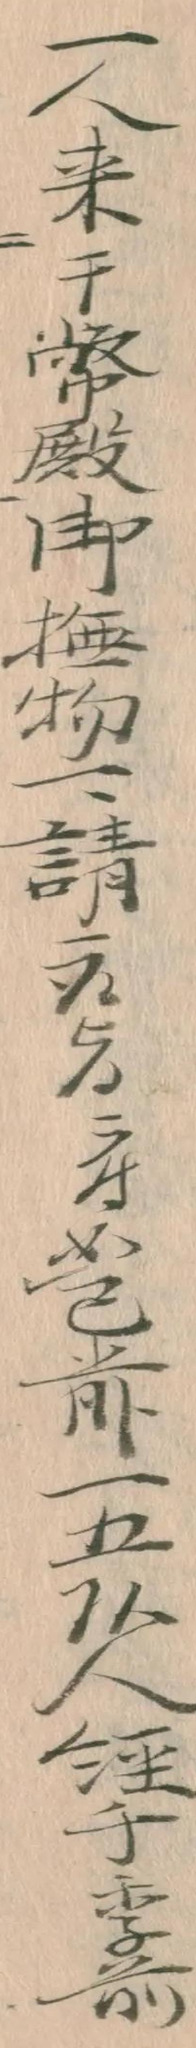一人来于幣殿御撫物可請取旨ニ付如已前五頭人経千季前
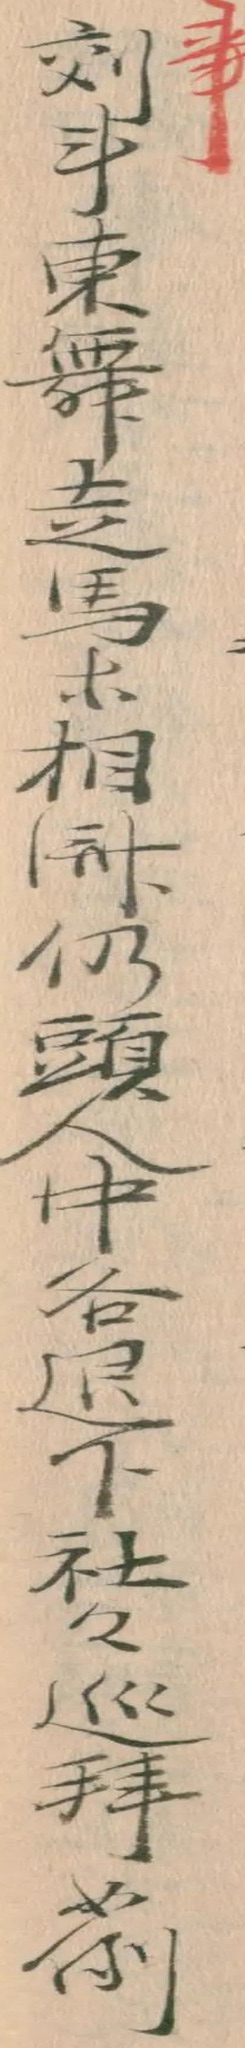刻斗東舞走馬等相済仍頭人中各退下社々巡拝如例
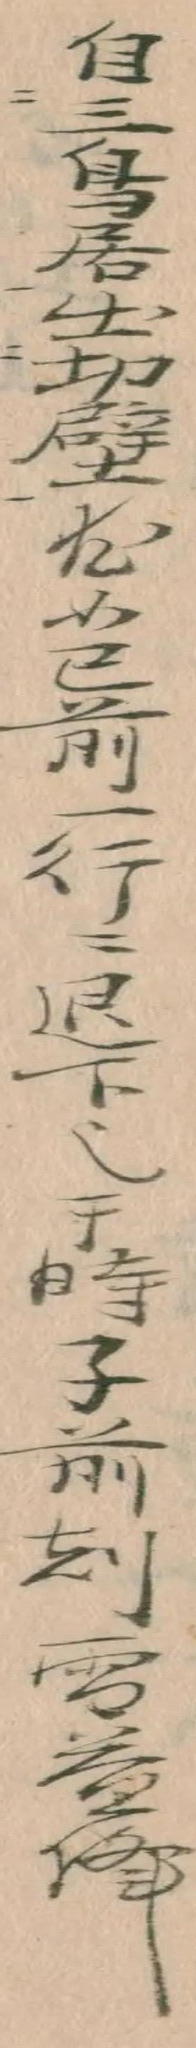自三鳥居出切壁尤如已前一行ニ退下也于時子前刻雪益降
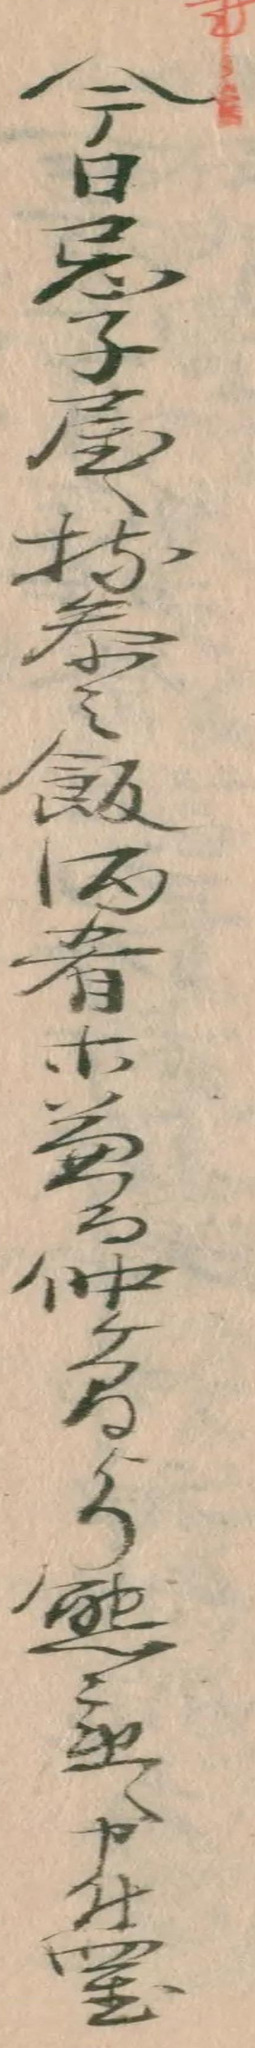一今日忌子屋へ持参之飯酒肴等兼而仲ケ間より熊之丞へ申付置
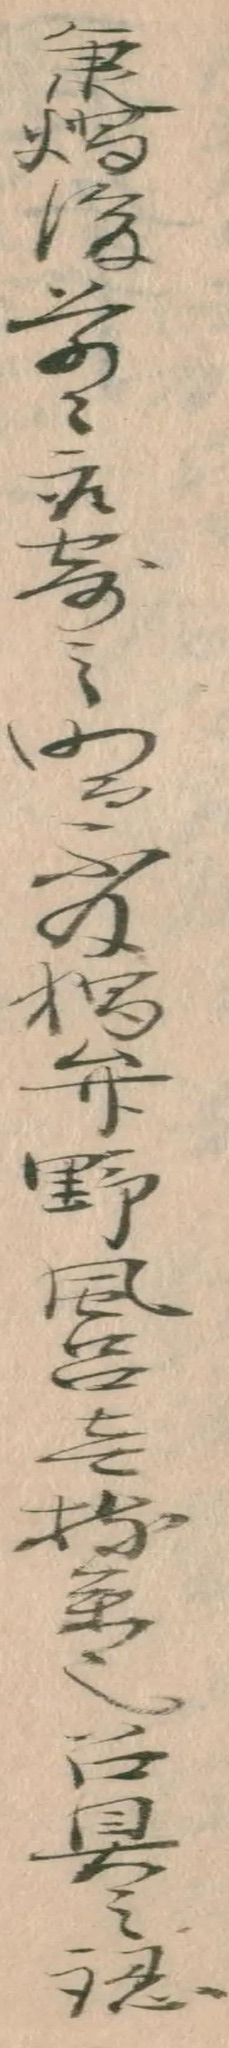秉燭後前々取寄之仍而不及獨弁野風呂壱持参也召具之認
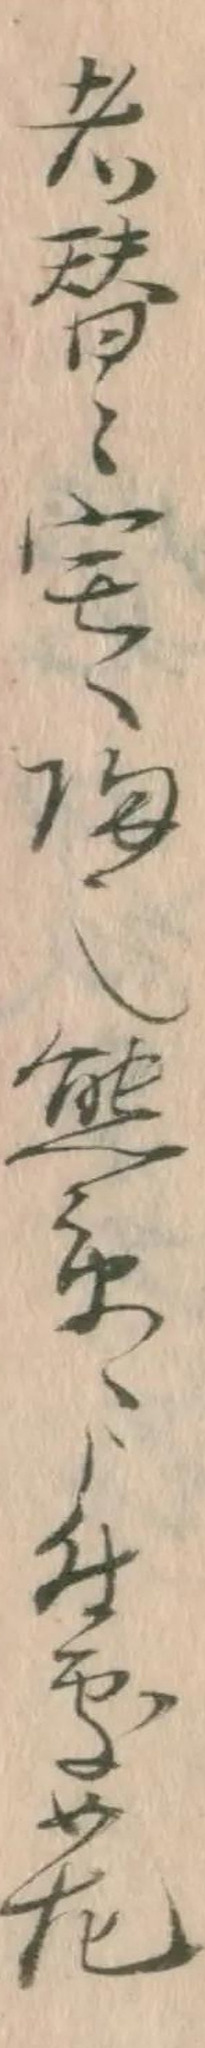者替々宅へ帰也熊之丞へ申付處如左
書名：賀茂社記録. 第74冊
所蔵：国立国会図書館 National Diet Library, JAPAN
